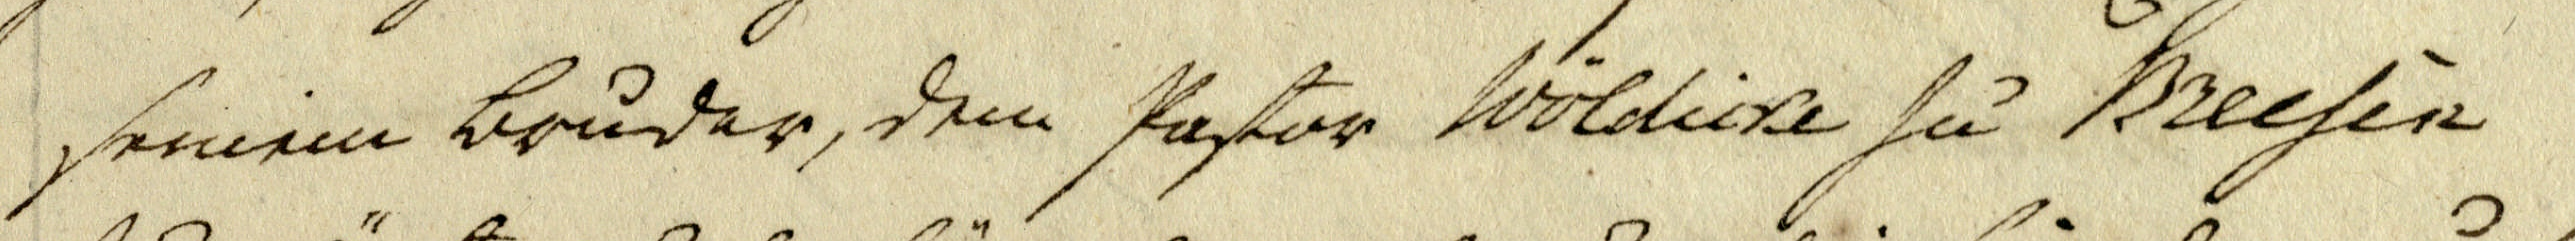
seinem Bruder, dem Pastor Wöldicke zu Breesen
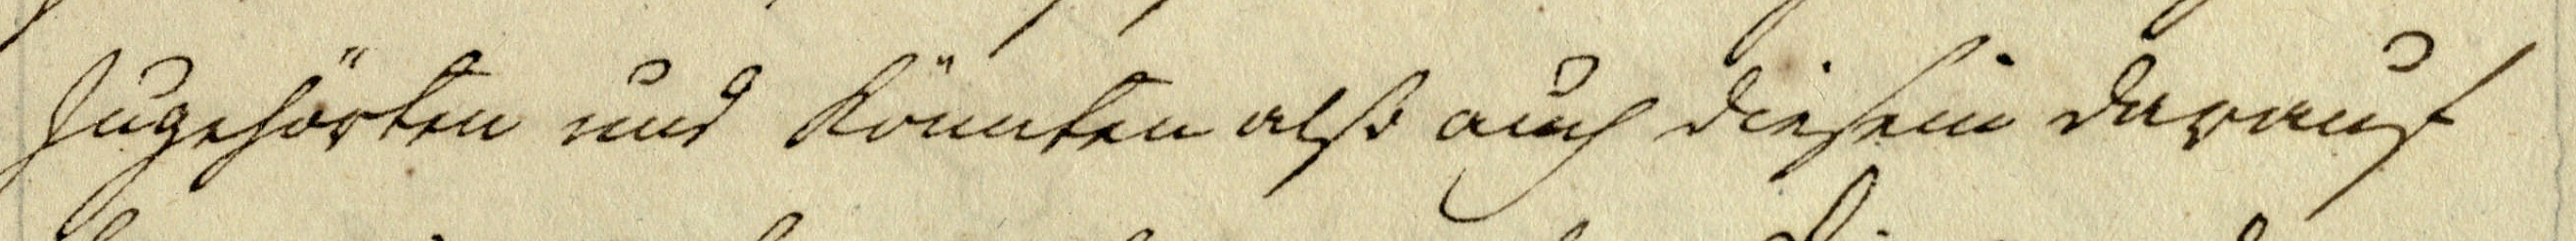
zugehörten und könnten also auch diesem darauf
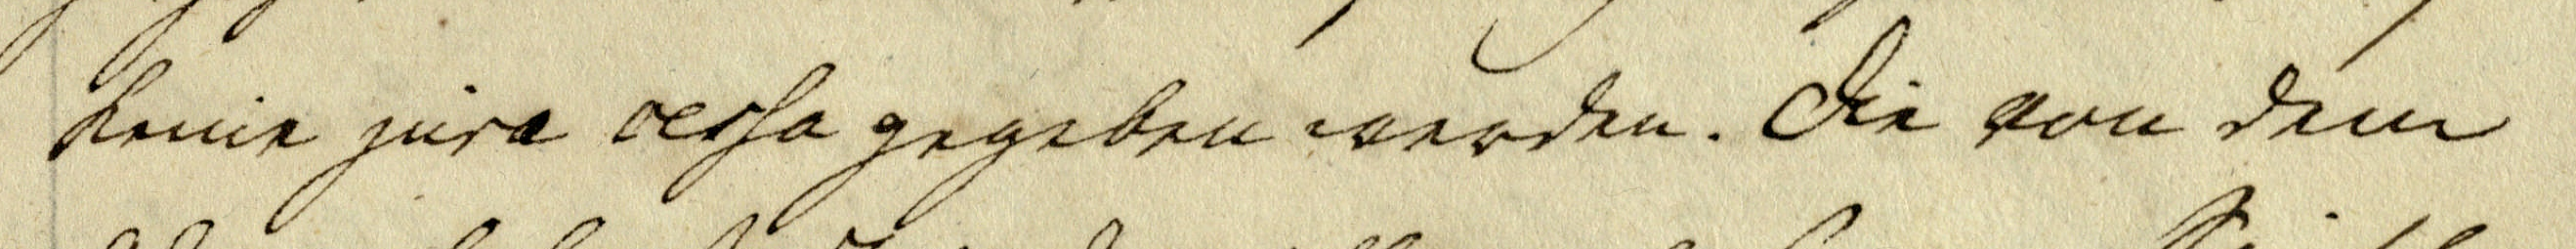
keine jura cessa gegeben werden. Die von dem
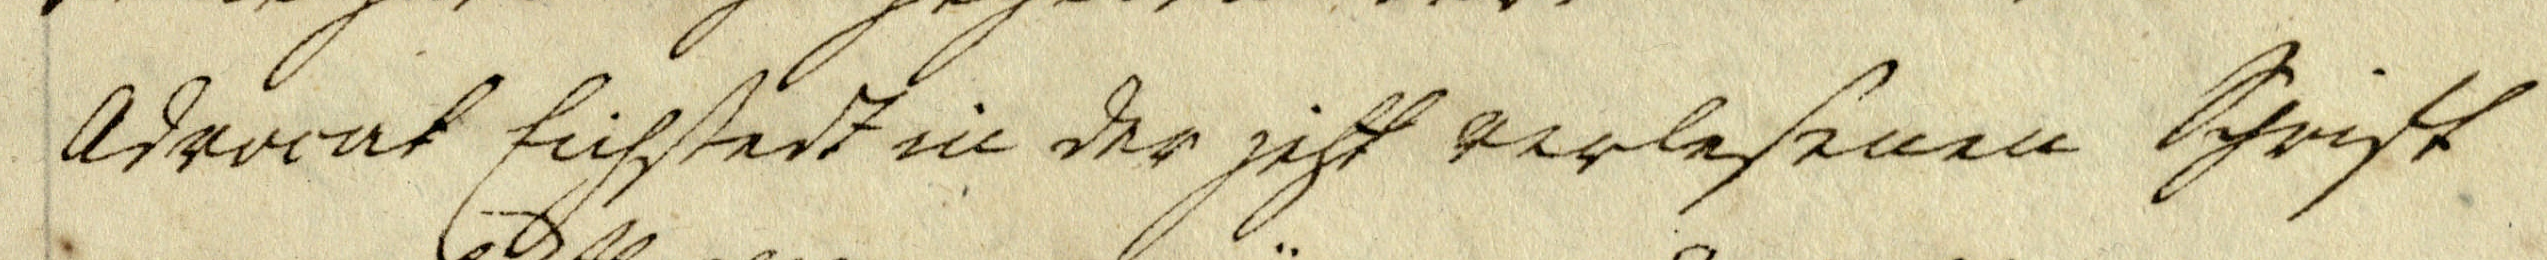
Advocat Eichstedt in der jetzt verlesenen Schrift
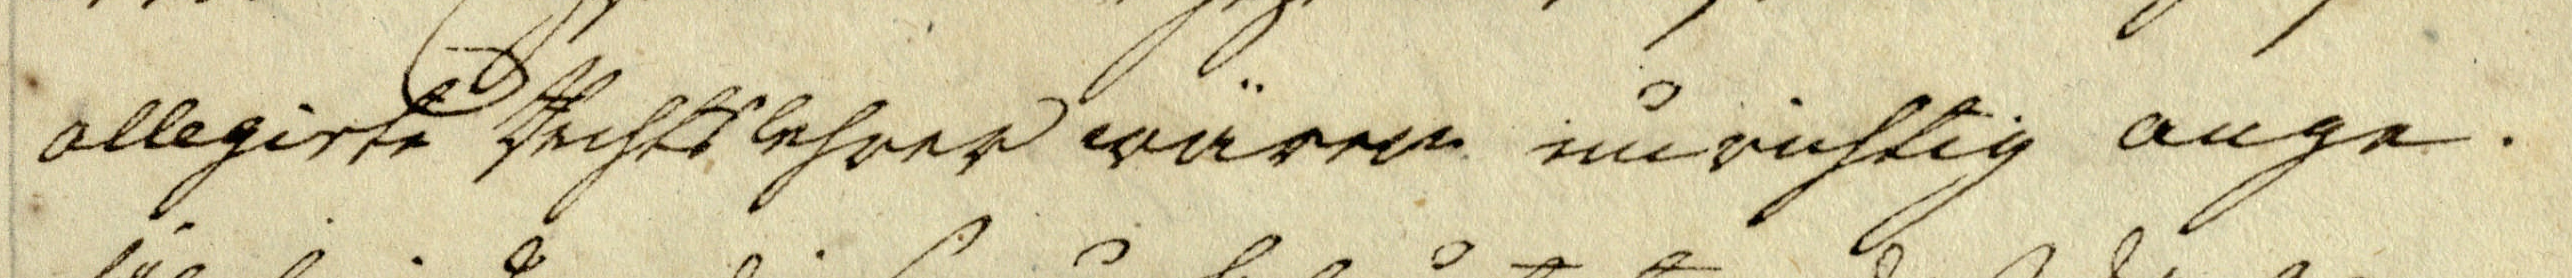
allegirte Rechts Lehrer wären unrichtig ange¬
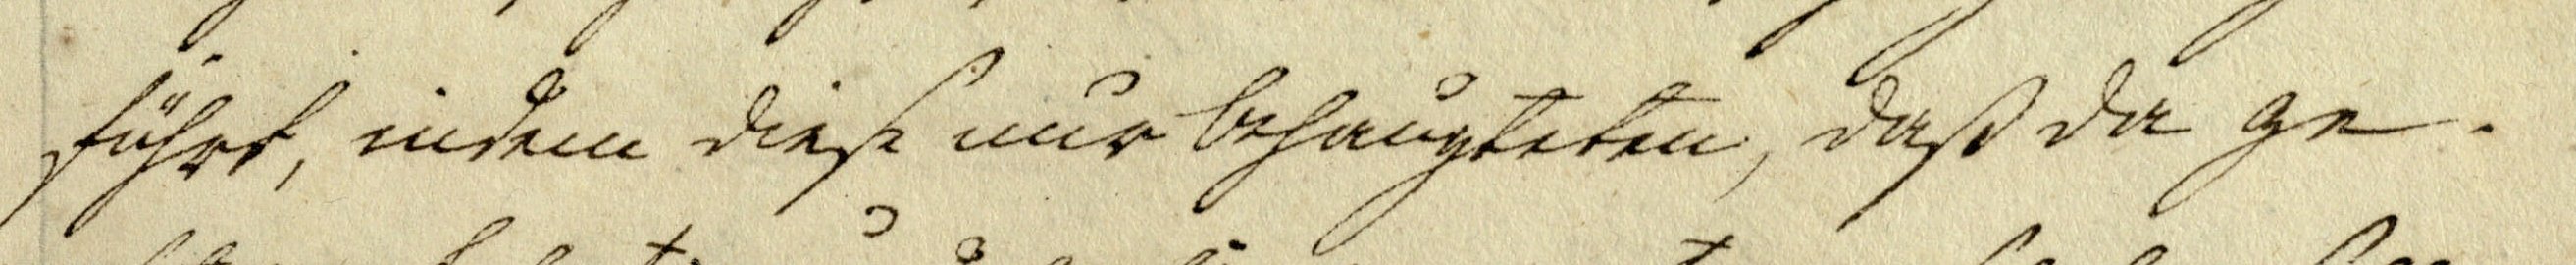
führt, indem diese nur behaupteten, daß da ge¬
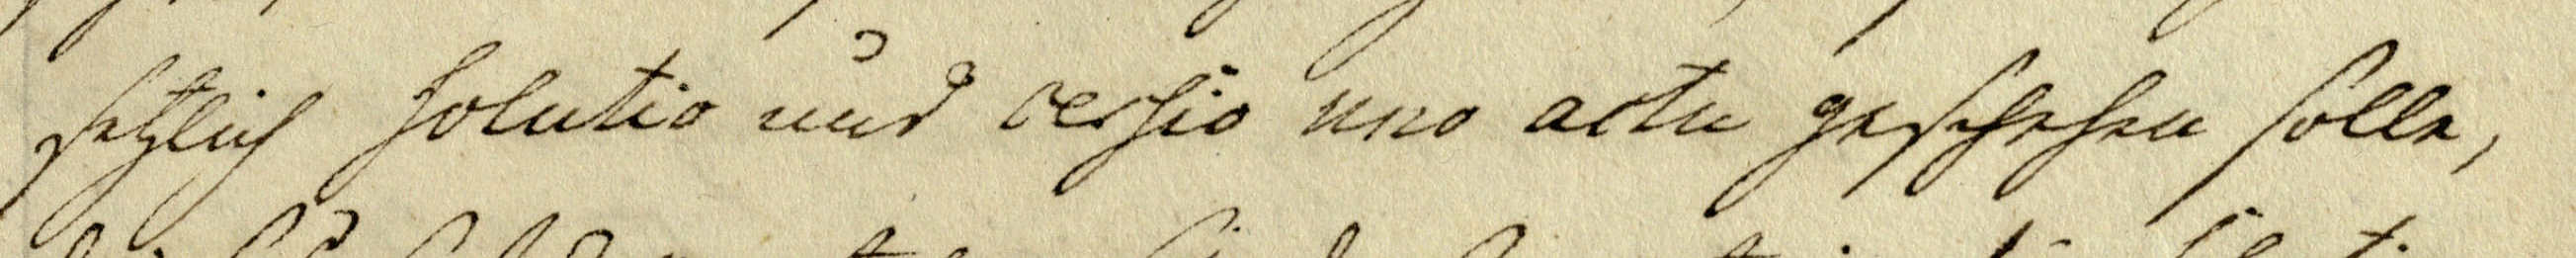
setzlich solutio und cessio uno actu geschehen solle,
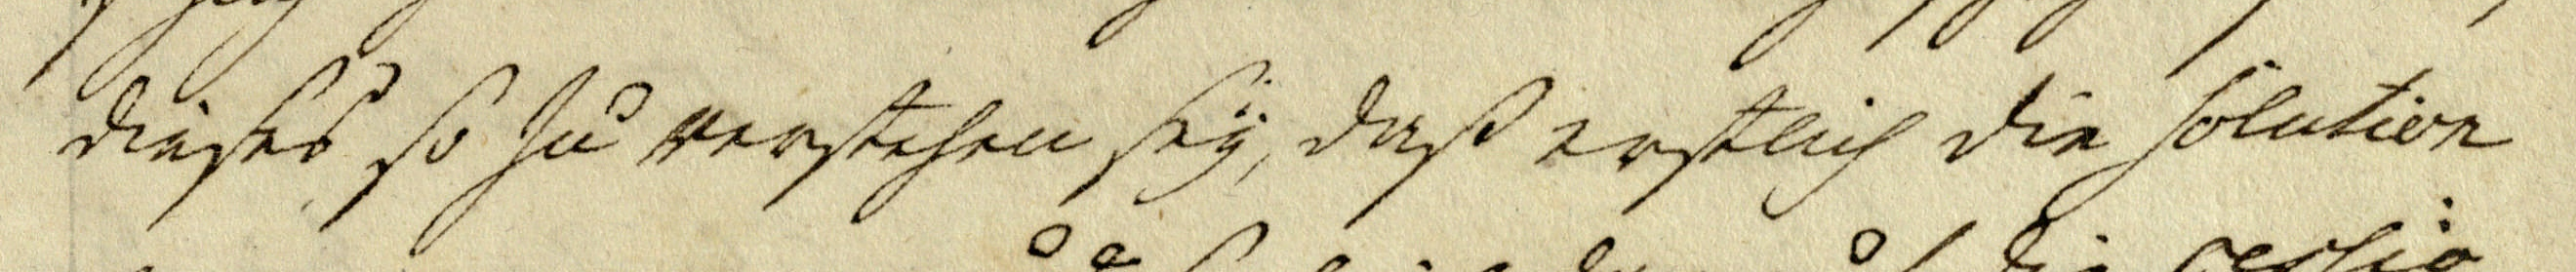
dieses so zu versehen seÿ, daß erstlich die Solution
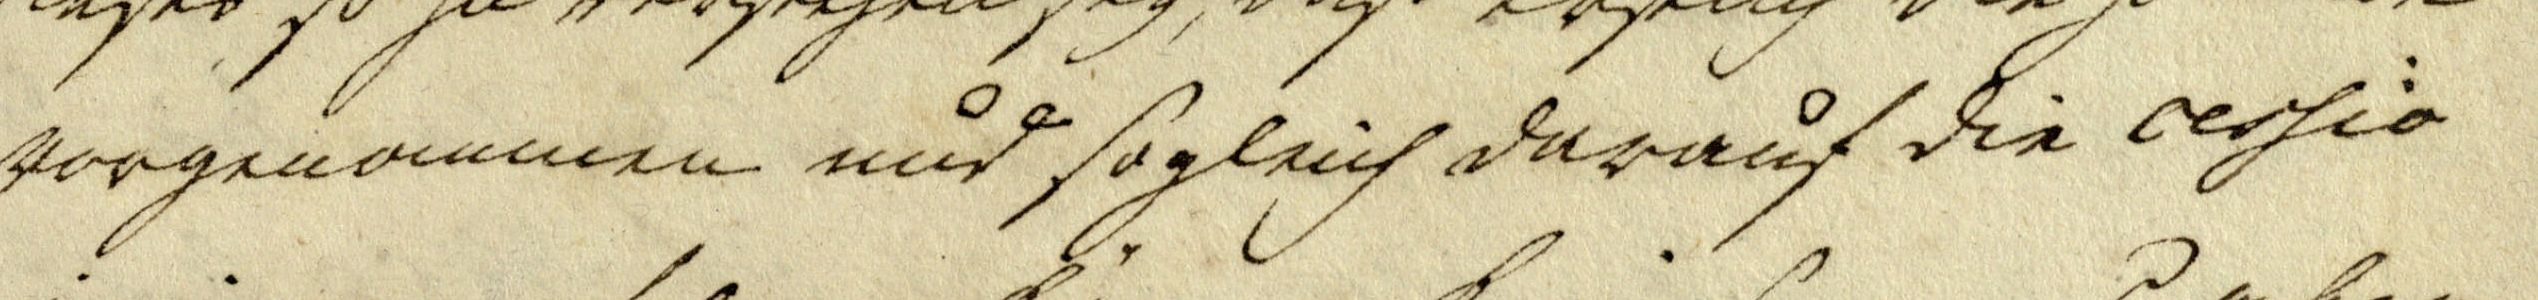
vorgenommen und sogleich darauf die cessio
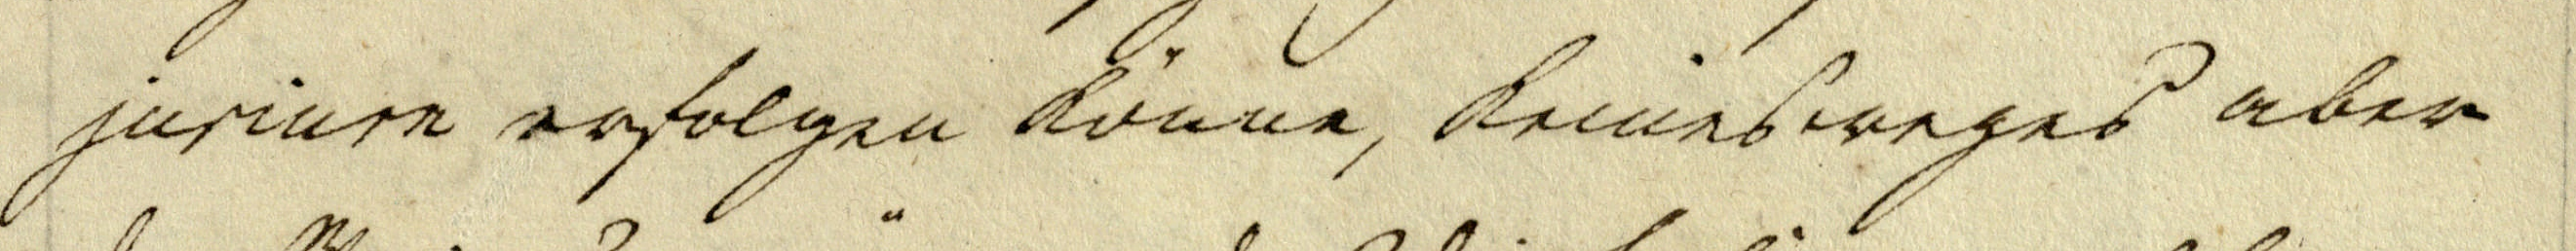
jurium erfolgen könne, keinesweges aber
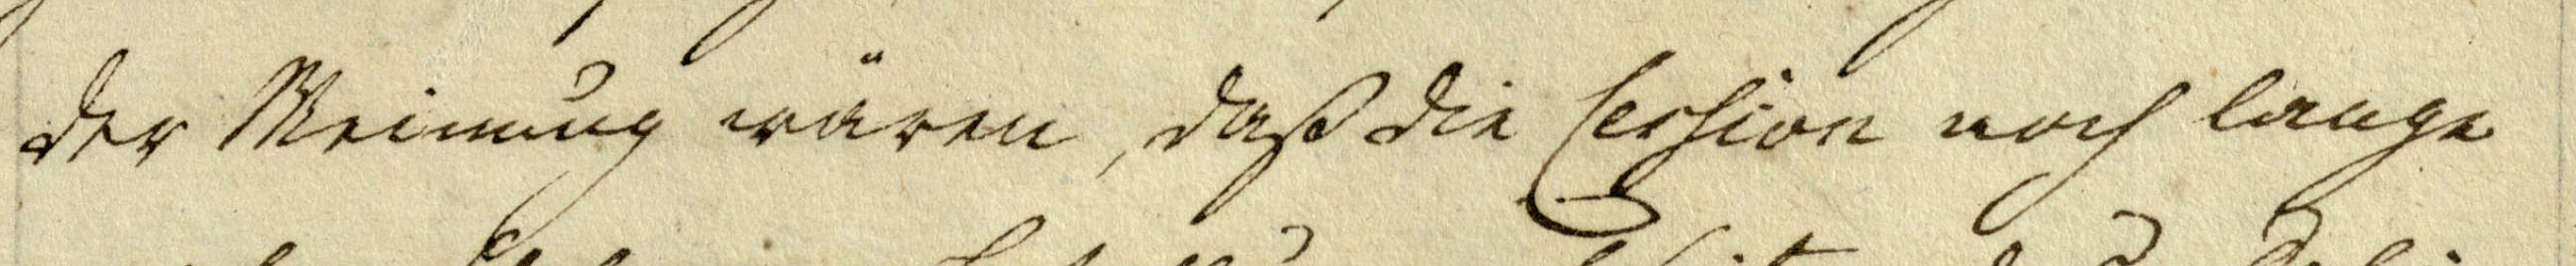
der Meinung wären, daß die Cession noch lange
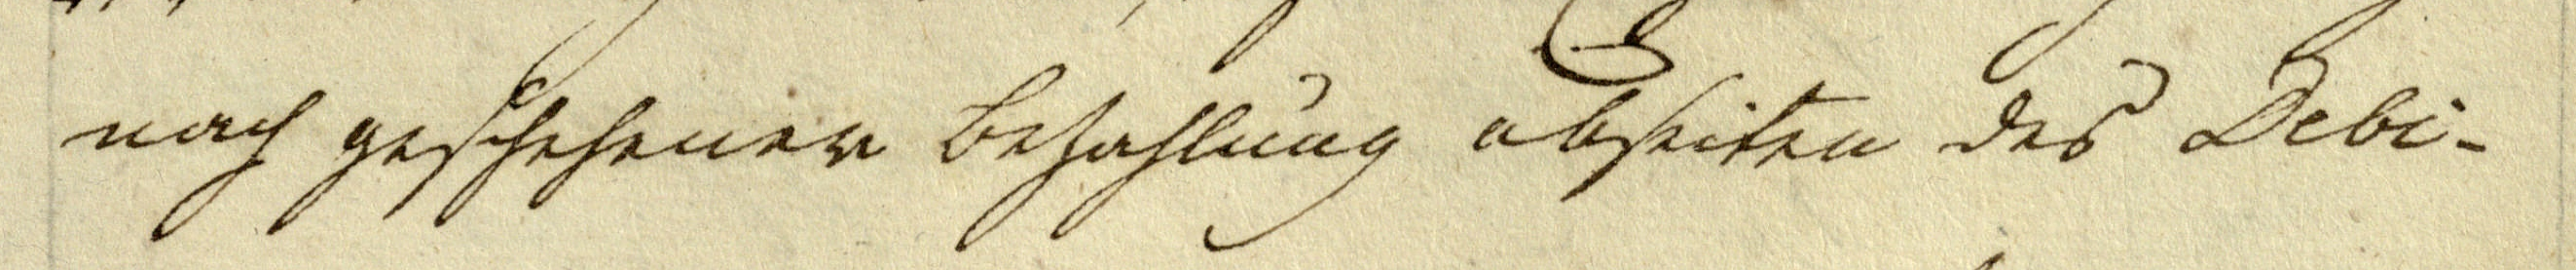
nach geschehener Bezahlung abseiten des Debi¬
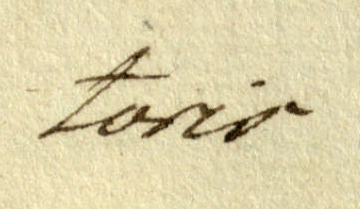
toris
